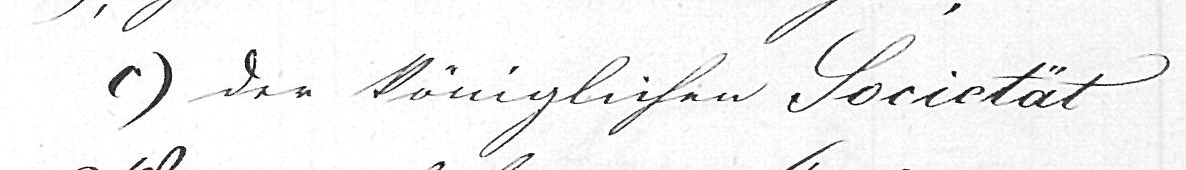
c) der königlichen Societät
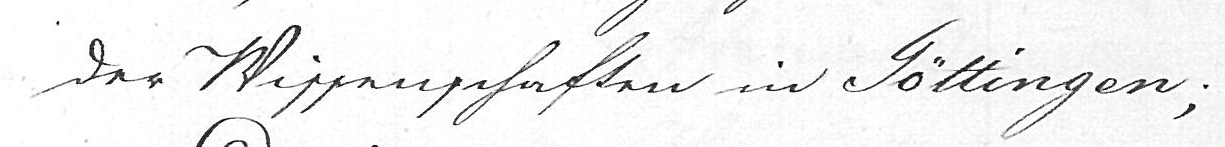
der Wissenschaften in Göttingen;
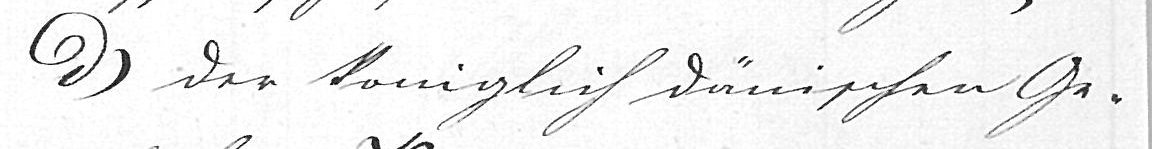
d) der koniglich dänischen Ge-
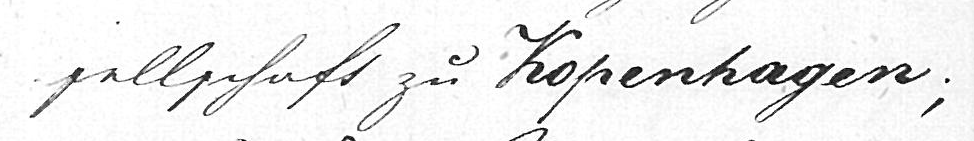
sellschaft zu Kopenhagen;
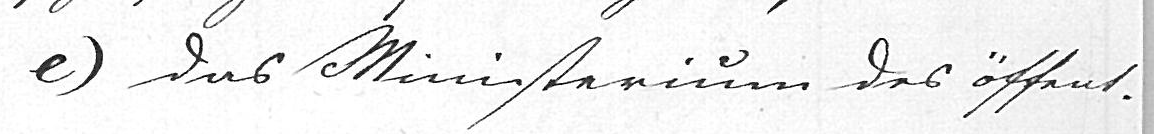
e) das Ministerium des öffent-
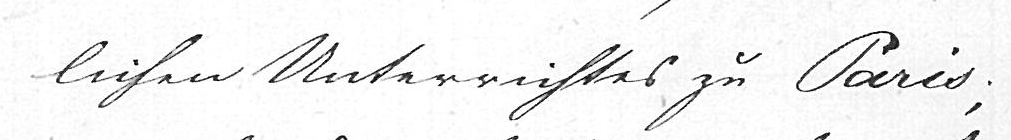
lichen Unterrichtes zu Paris;
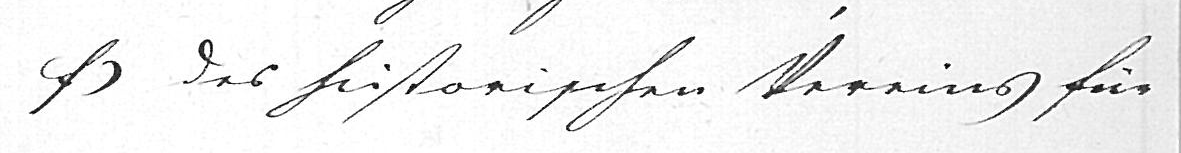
f) des historischen Vereines für
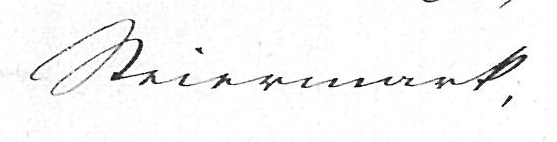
Steiermark,
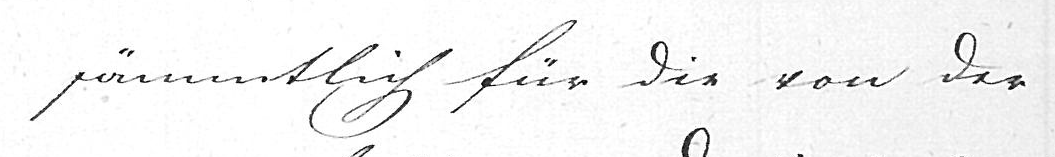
sämmtlich für die von der
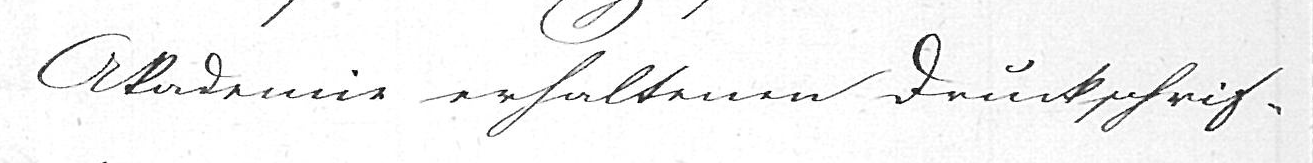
Akademie erhaltenen Druckschrif-
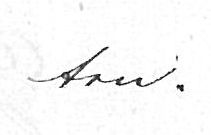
ten.
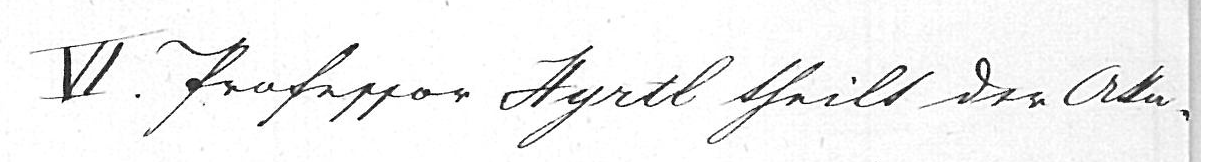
VI. Professor Hyrtl theilt der Aka-
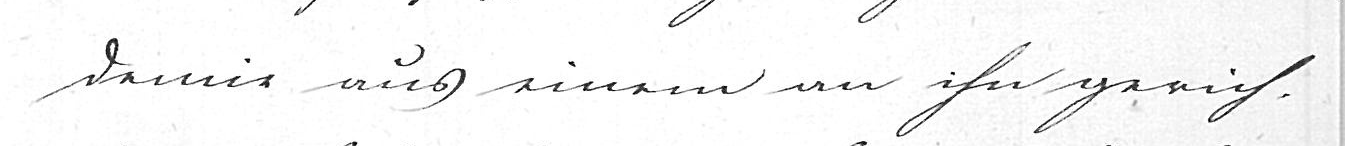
demie aus einem an ihn gericht-
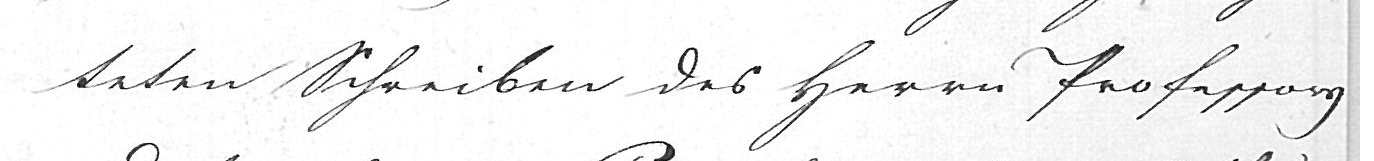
teten Schreiben des Herrn Professors
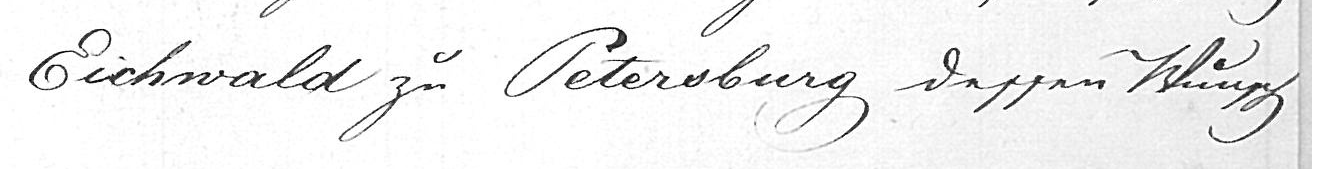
Eichwald zu Petersburg dessen Wunsch
